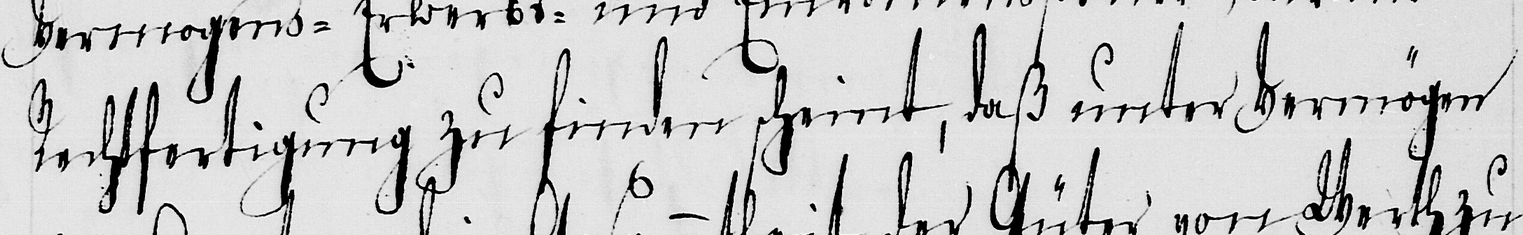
Rechtfertigung zu finden scheint, daß unter Vermögen
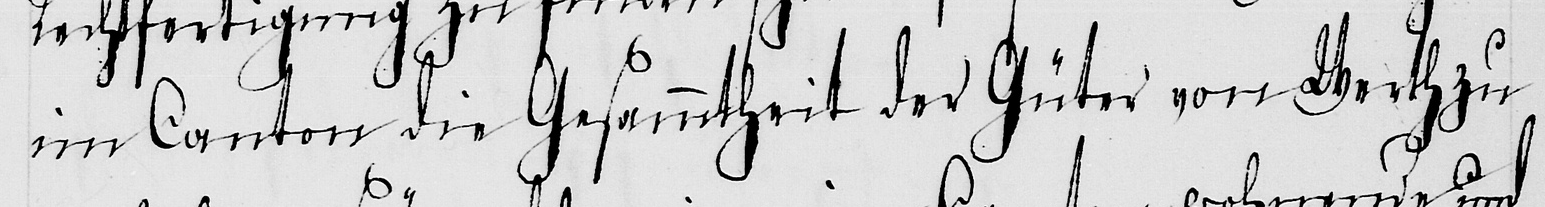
im Canton die Gesamtheit der Güter von Werth zu
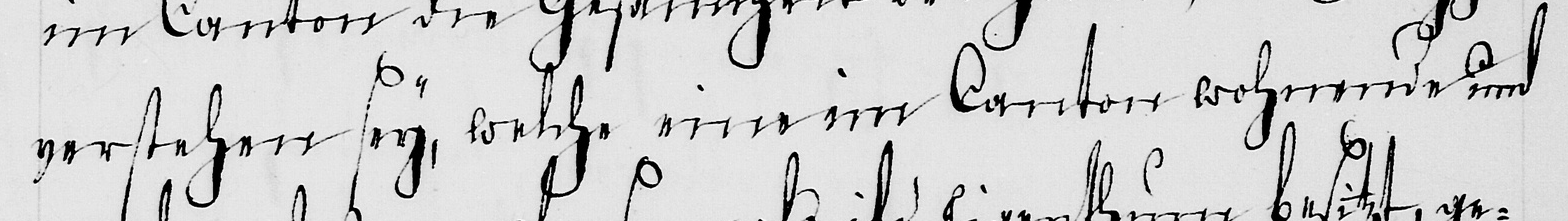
verstehen sey, welche eine im Canton wohnende und
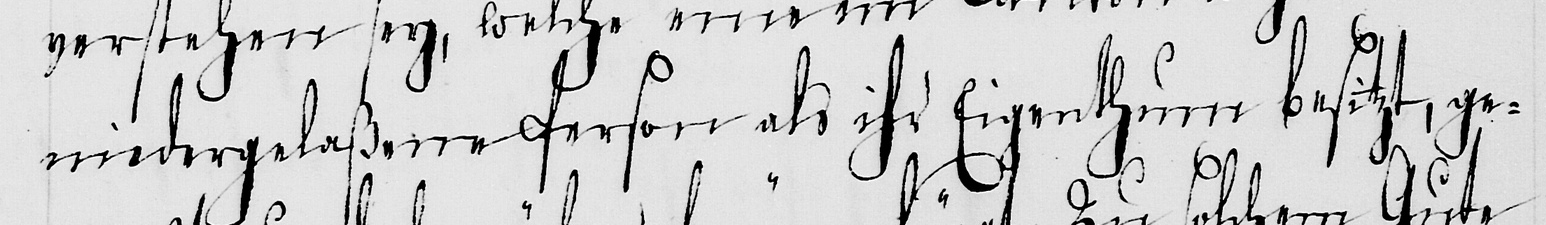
niedergelaßene Person als ihr Eigenthum besitzt, g¬
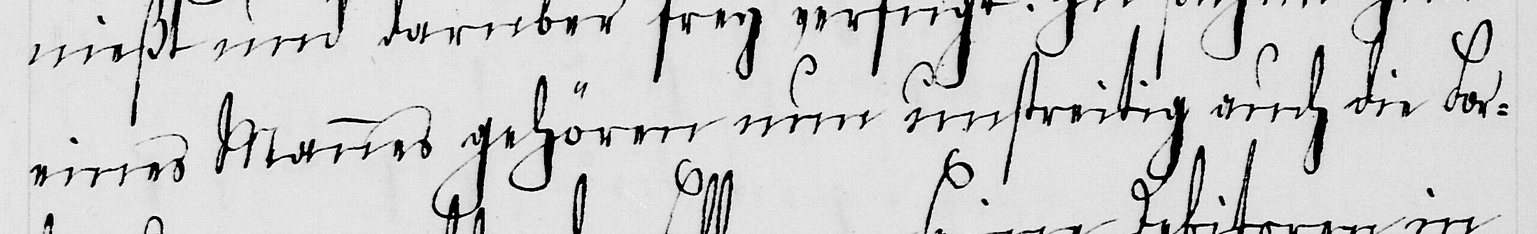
eines Mannes gehören nun unstreitig auch die For¬
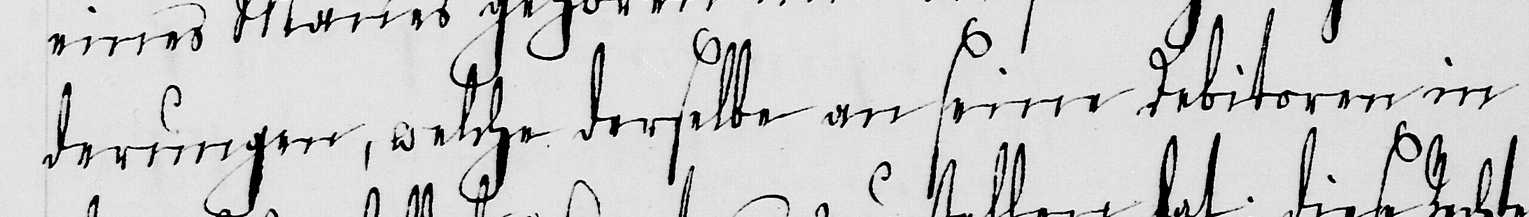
derungen, welche derselbe an seine Debitoren in
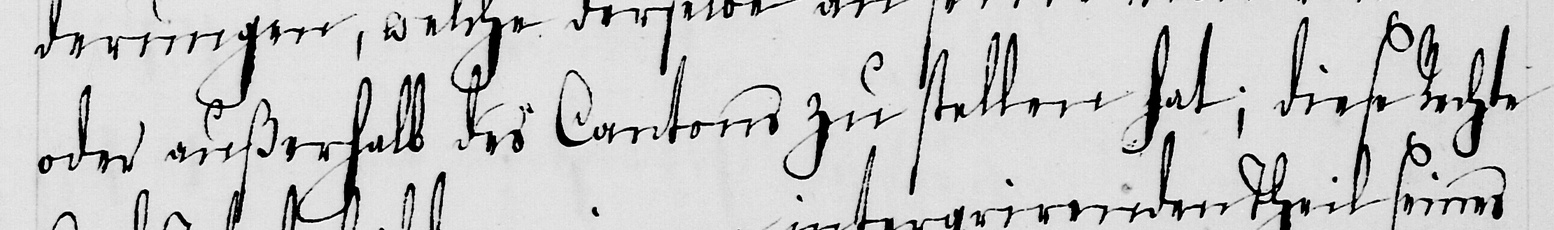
oder außerhalb des Cantons zu stellen hat; diese Rechte
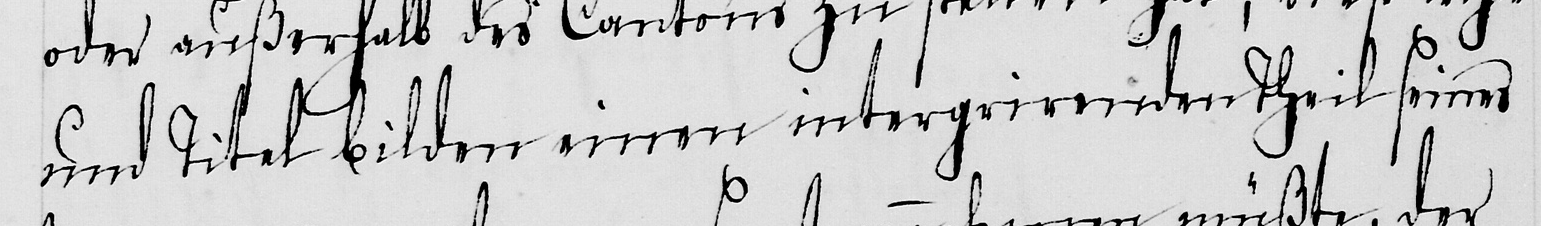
und Titel bilden einen integrierenden Theil seines
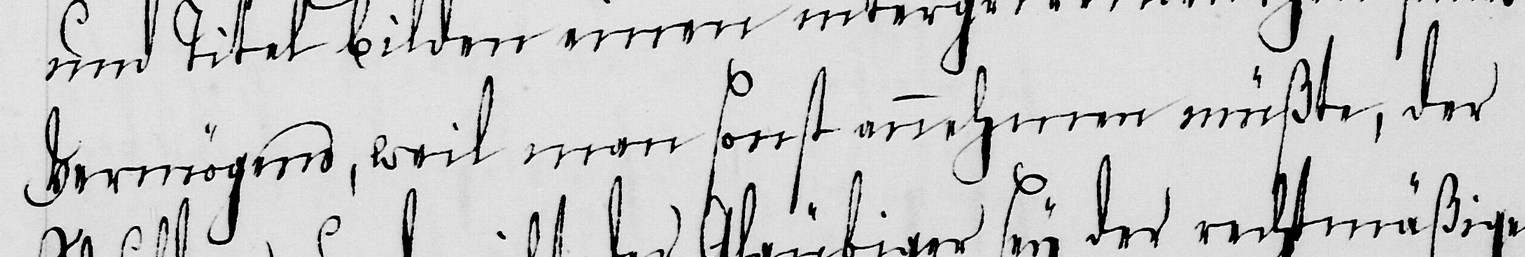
Vermögens, weil man sonst annehmen müßte, der
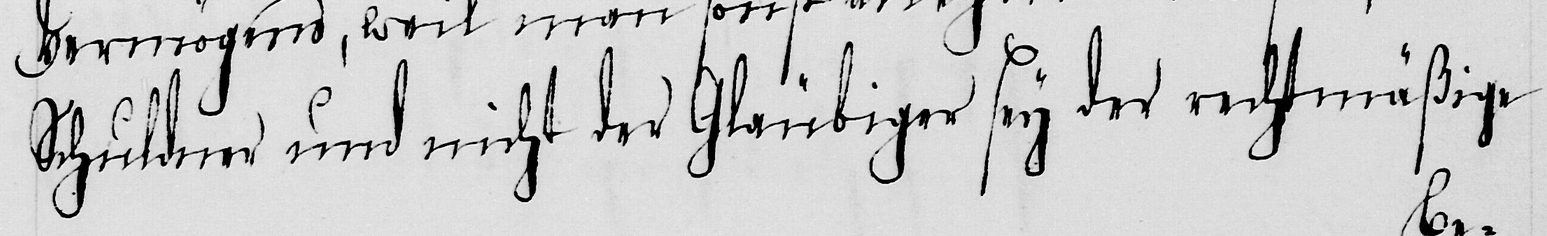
Schuldner und nicht der Gläubiger sey der rechtmäßige
